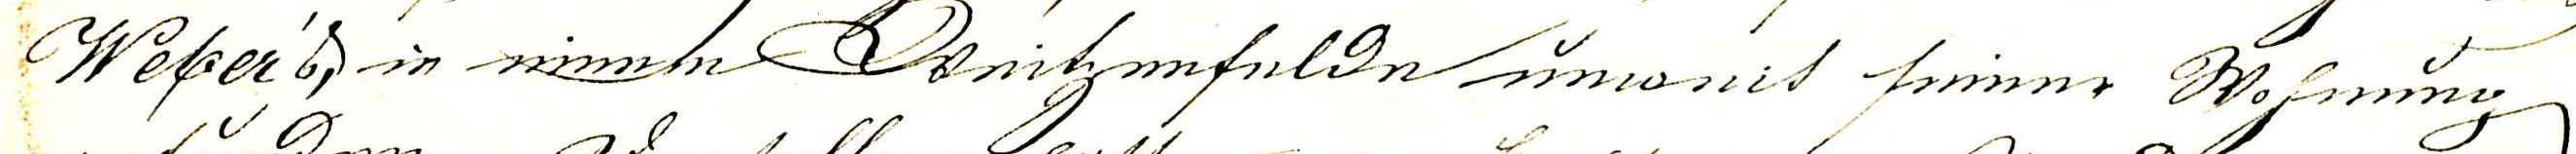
Weber’s in einen Weitzenfelde unweit seiner Wohnung
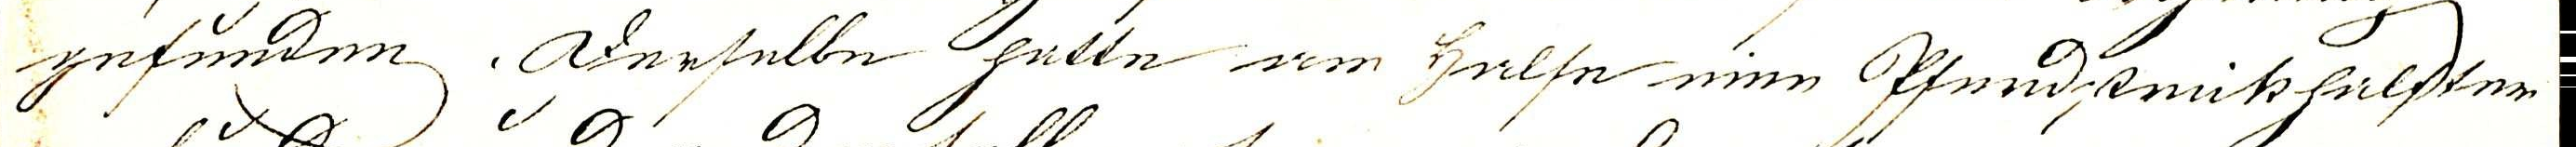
gefunden. Derselbe hatte am Halse eine Pferdstrickhaltter
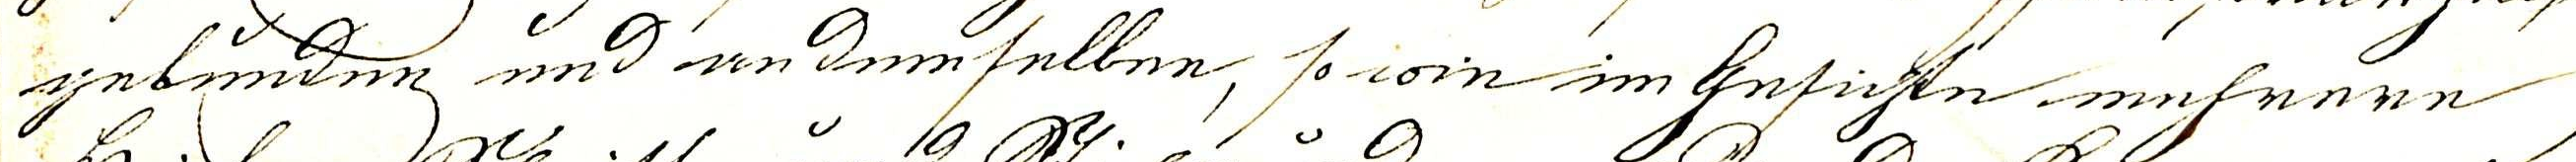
gebunden und an demselben, so wie im Gesichte mehrere
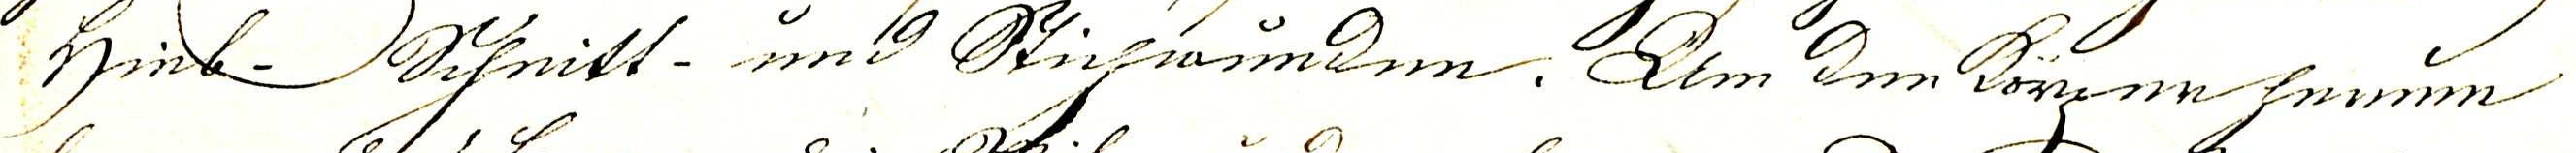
Hieb- Schnitt- und Stichwunden. Um den Körper herum
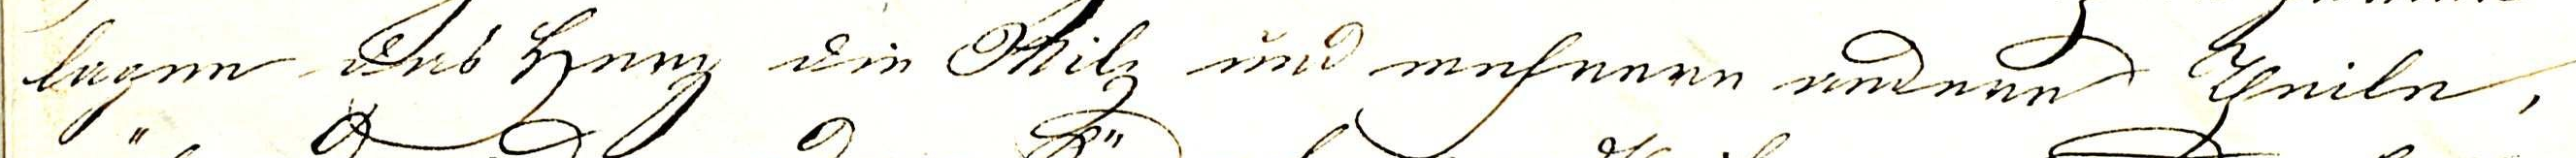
lagen das Herz die milz und mehrere andere Theile,
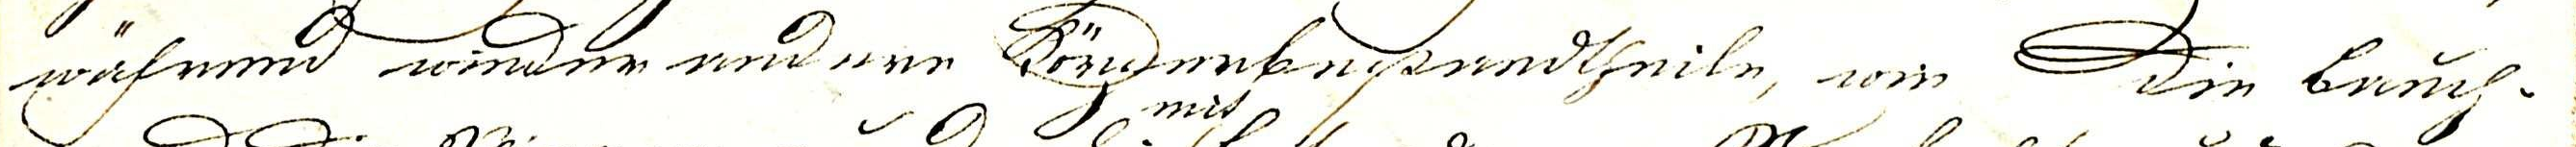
während wieder andere Körperbestandtheile, wie die Bauch¬
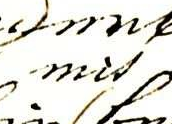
mit
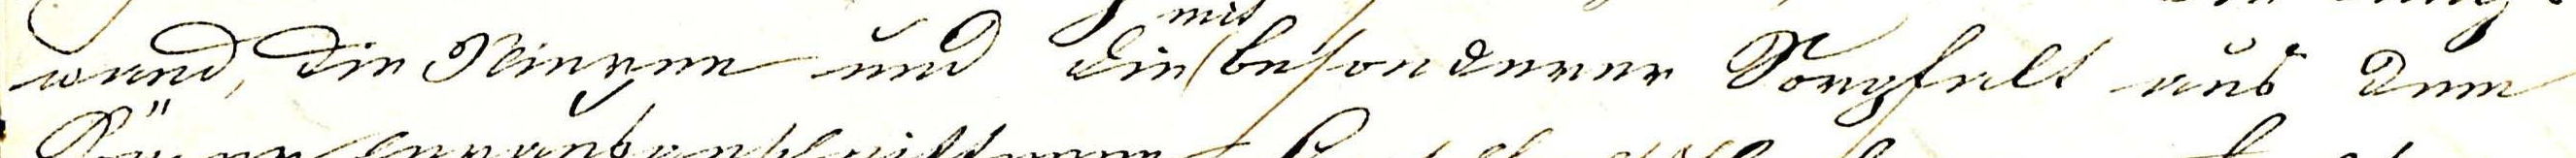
wand die Nieren und die besonderer Sorgfalt aus dem
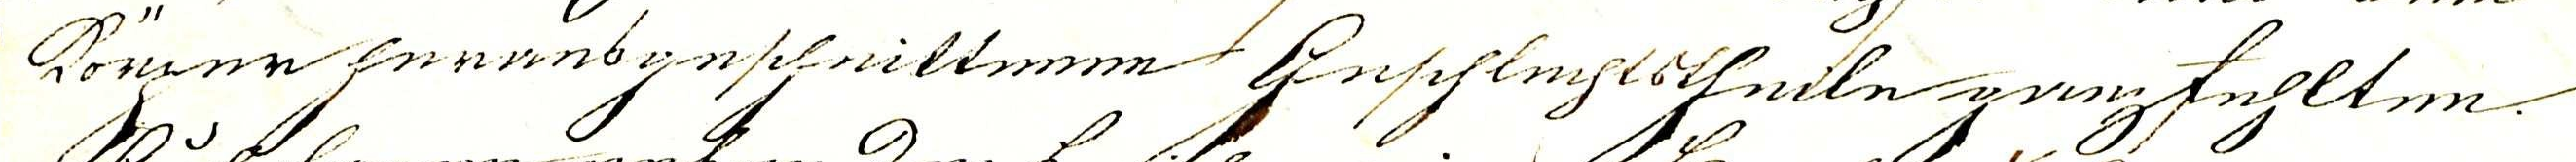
Körper herausgeschnittenen Geschlechtstheile ganz fehlten.
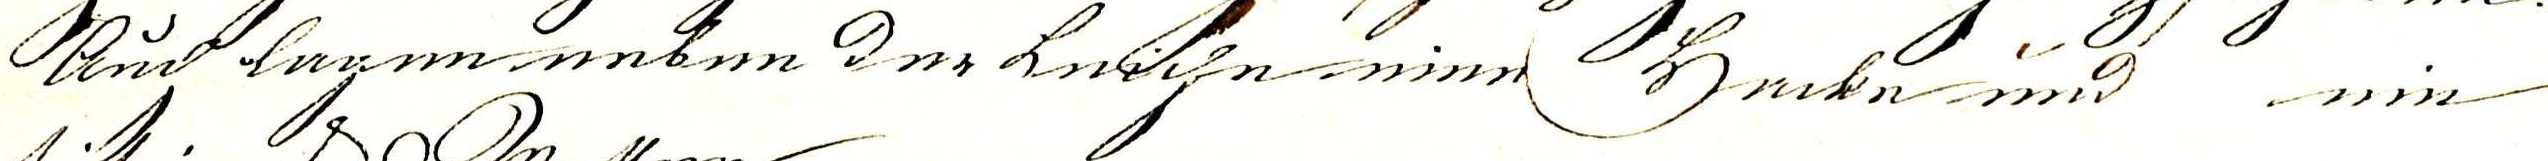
Auch lagen neben der Leiche eine Hacke und ein
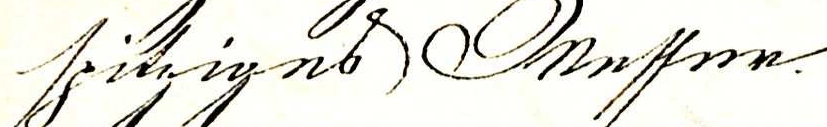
spitziges Messer.
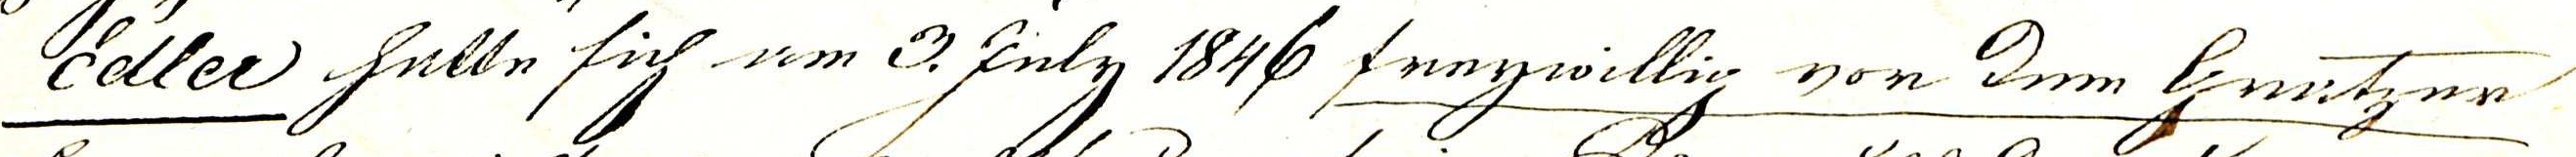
Edler hatte sich am 3. July 1846 freywillig vor dem Gratzer
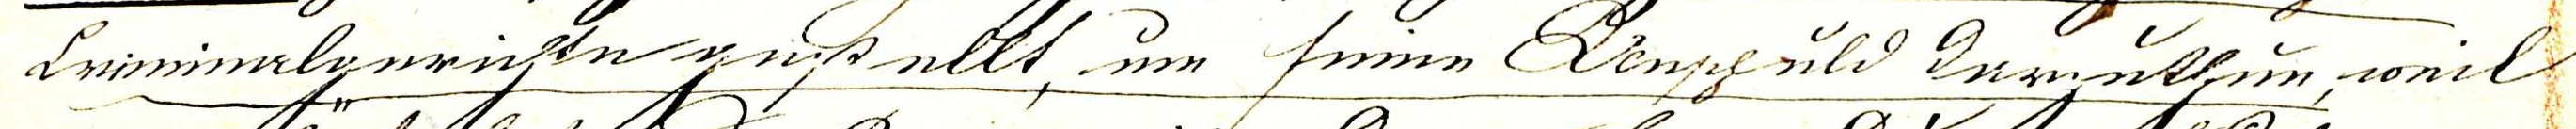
Criminalgerichte gestellt, um seine Unschuld darzuthun, weil
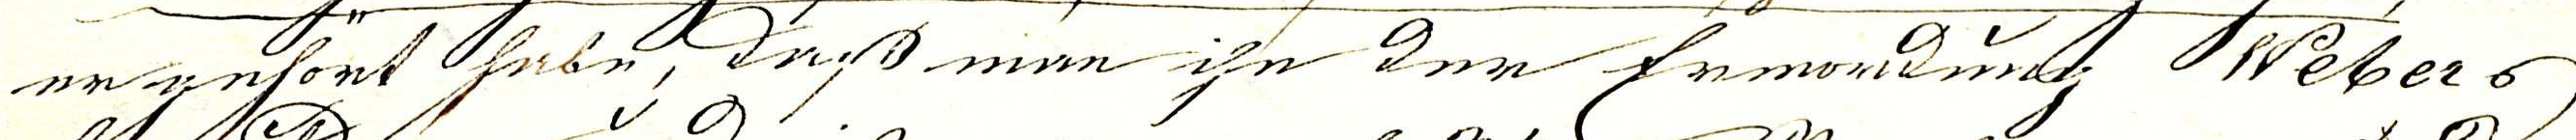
er gehört habe, das man ihn der Ermordung Webers
